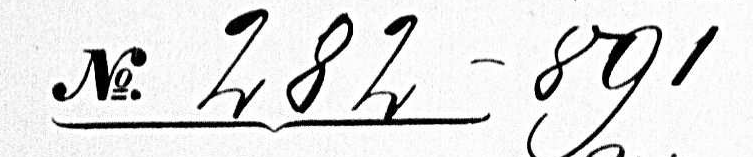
No. 282 – 1891
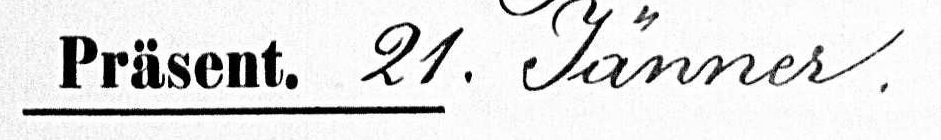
Präsent. 21 Jänner
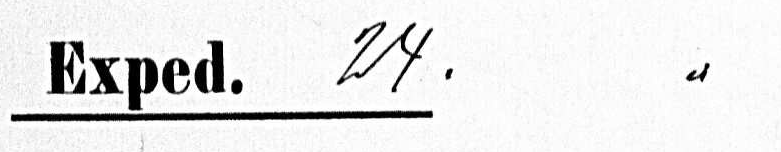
Expedit 24. Jänner
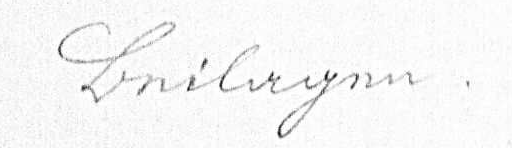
Beilagen
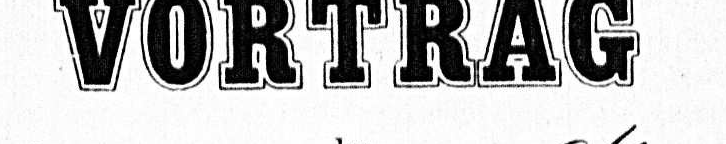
VORTRAG
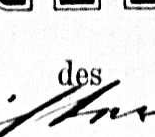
Des
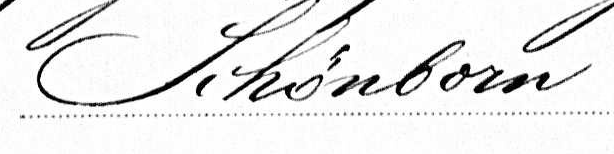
Schönborn
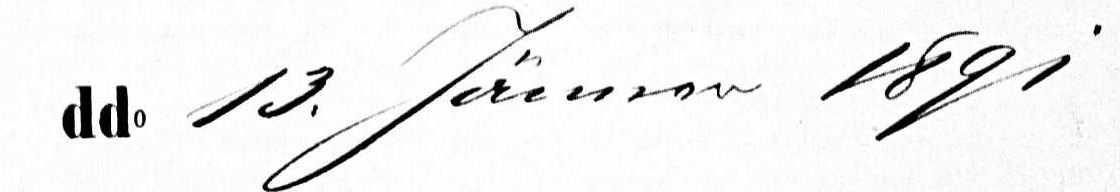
Ddo 13 Jänner 1891
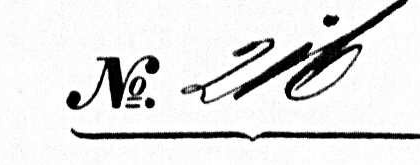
No 216
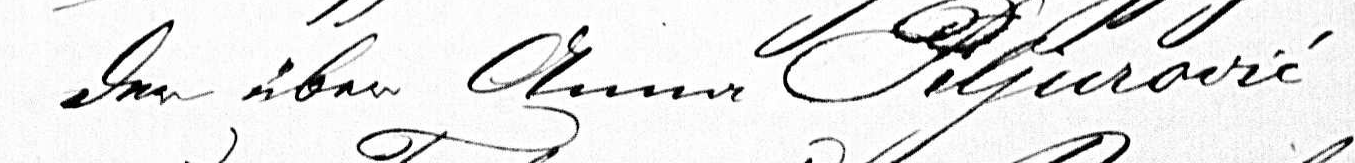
der über Anna Piljurović
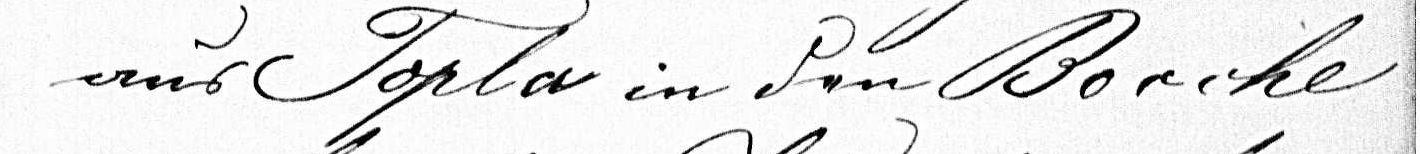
aus Topla in den Boroche
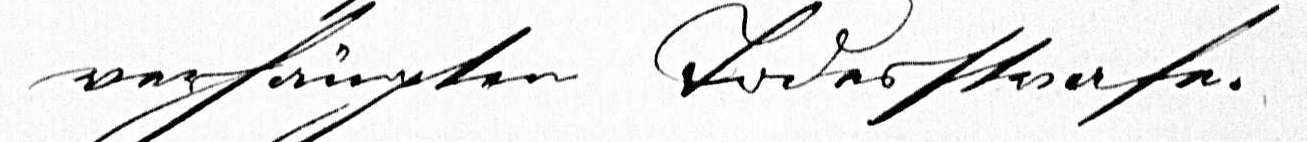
verhängte Todesstrafe.
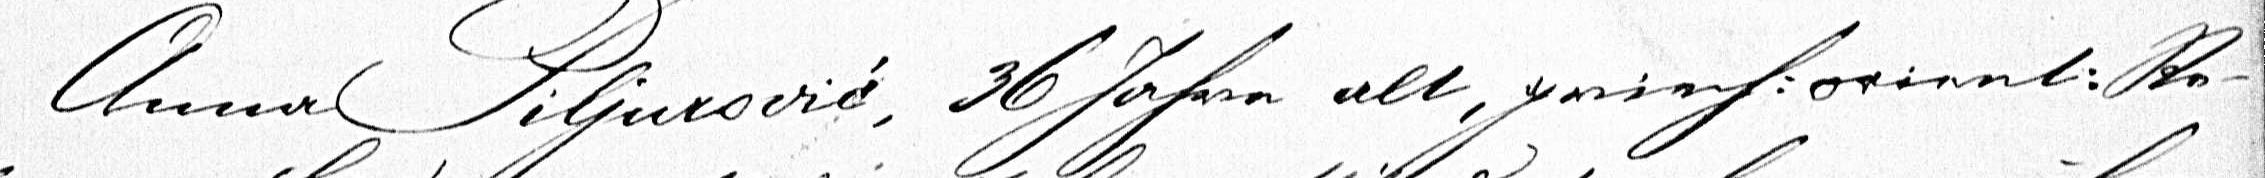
Anna Piljinović, 36 Jahre alt, griech.orient. Re¬
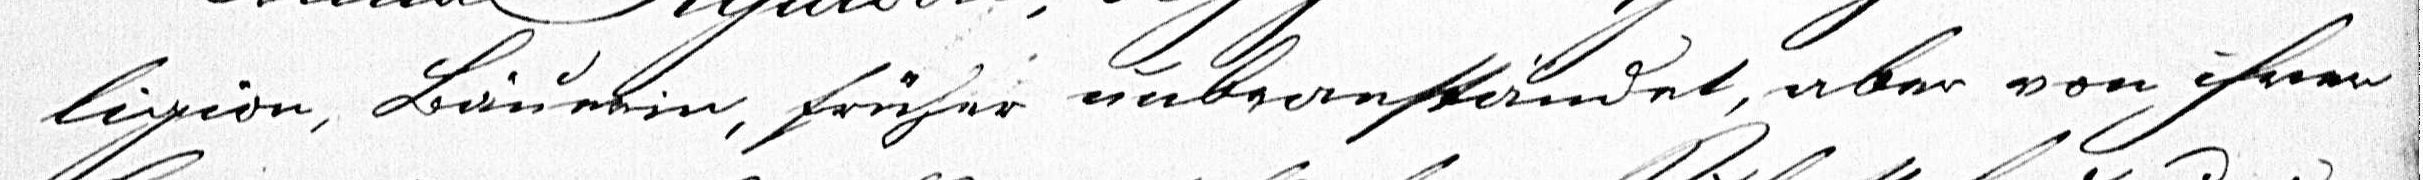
ligion, Bäuerin, früher unbeanstandet, aber von ihrem
